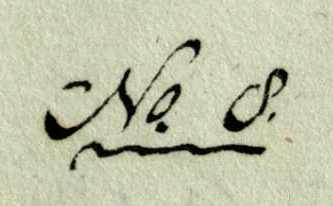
No 8.
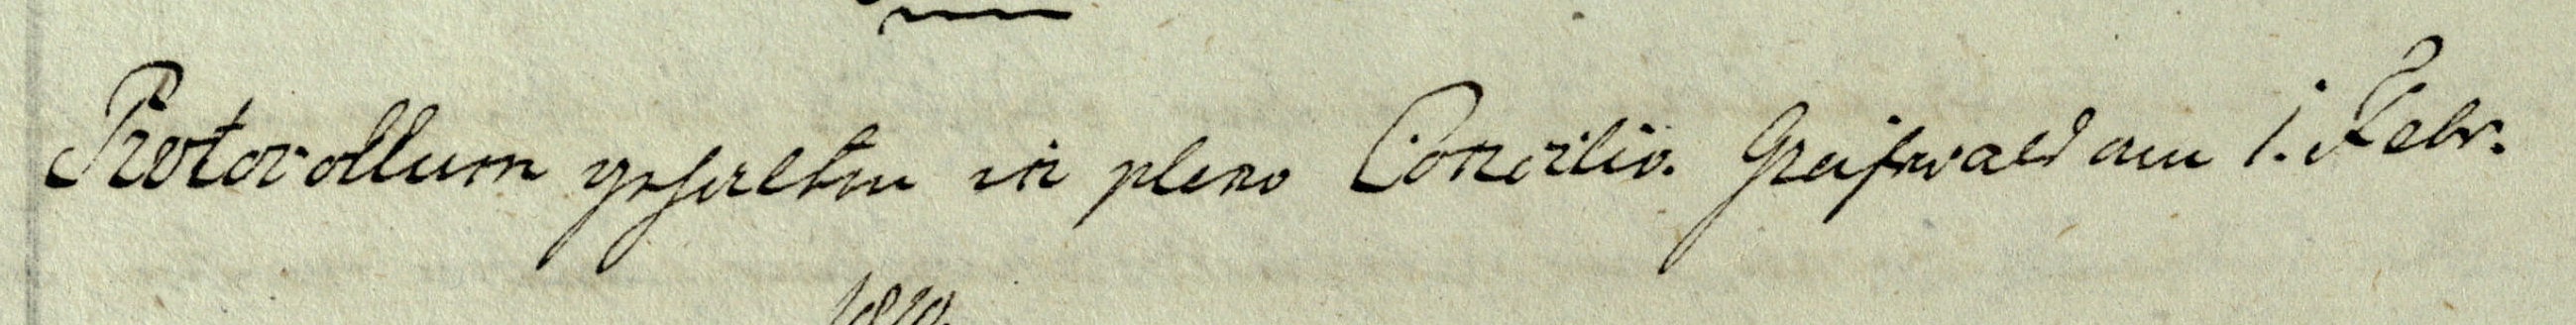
Protocollum gehalten in pleno Concilio Greifswald am 1. Febr.
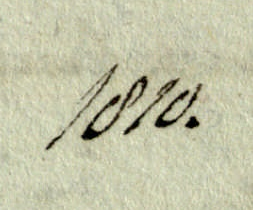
1810.
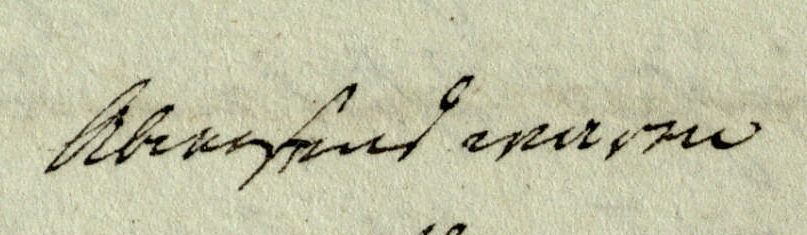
Abwesend waren
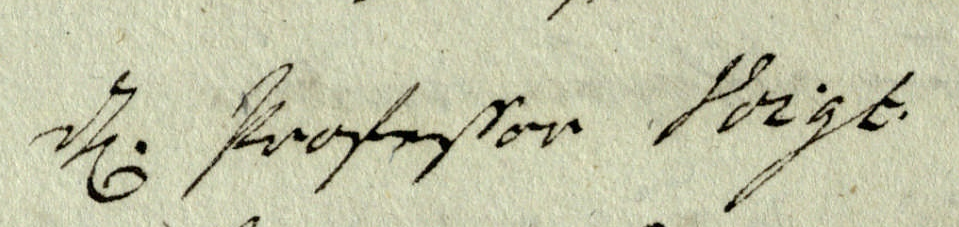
dh. Professor Voigt.
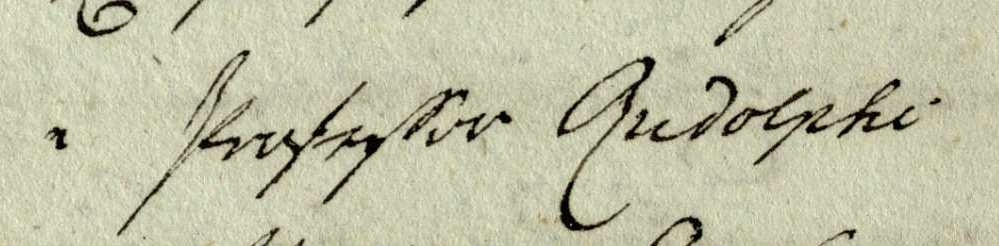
Professor Rudolphi
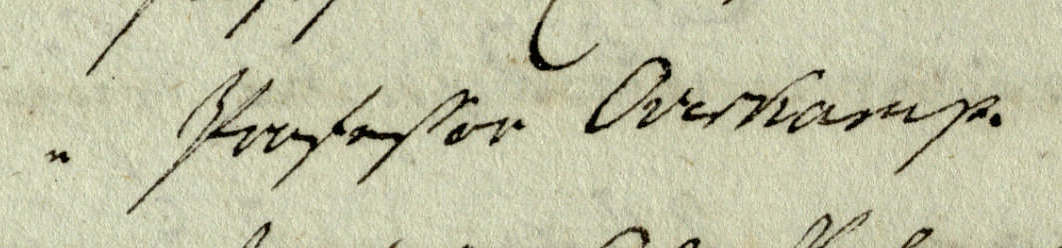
Professor Overkamp.
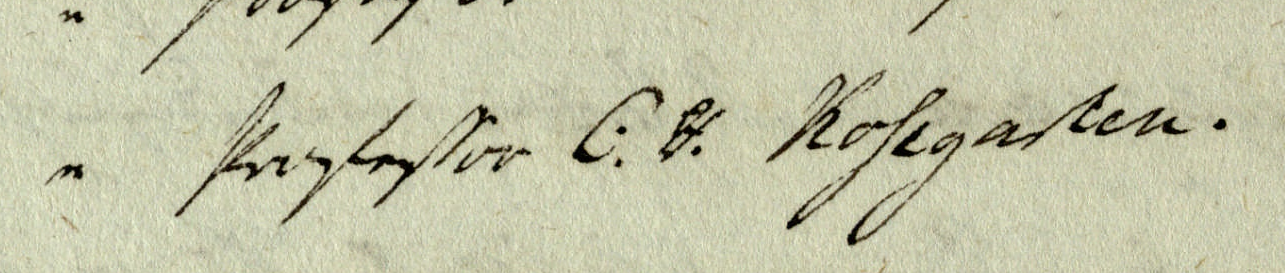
Professor C. R. Kosegarten.
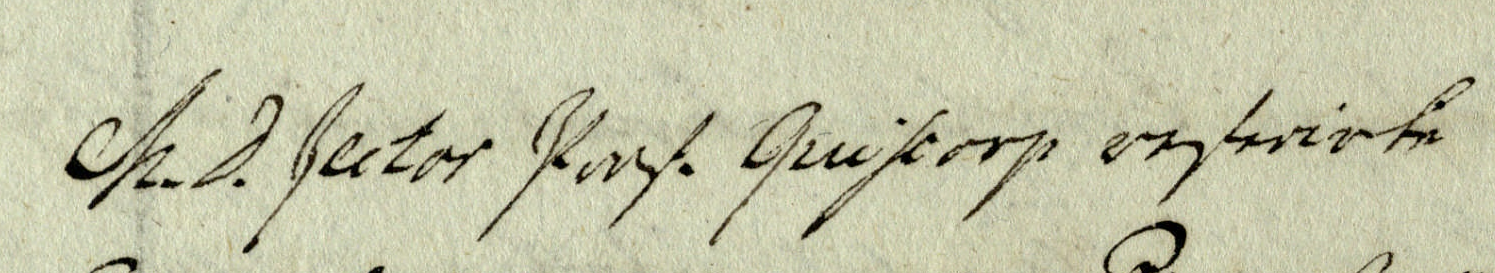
M. D. Rector Prof. Quistorp referirte
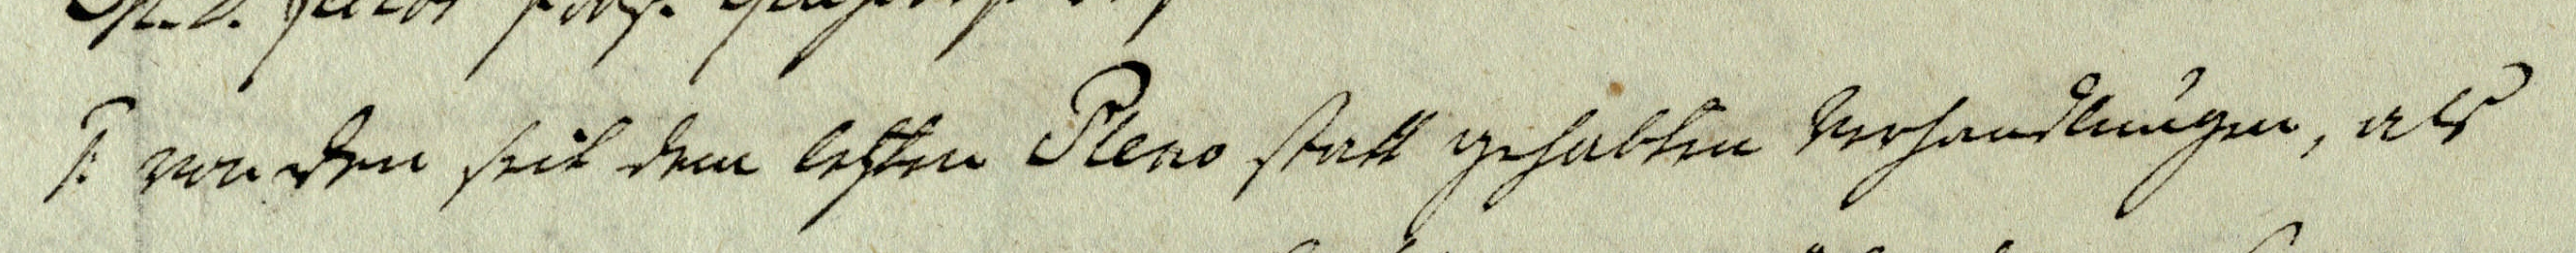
1. von den seit dem letzten Pleno statt gehabten Verhandlungen, als
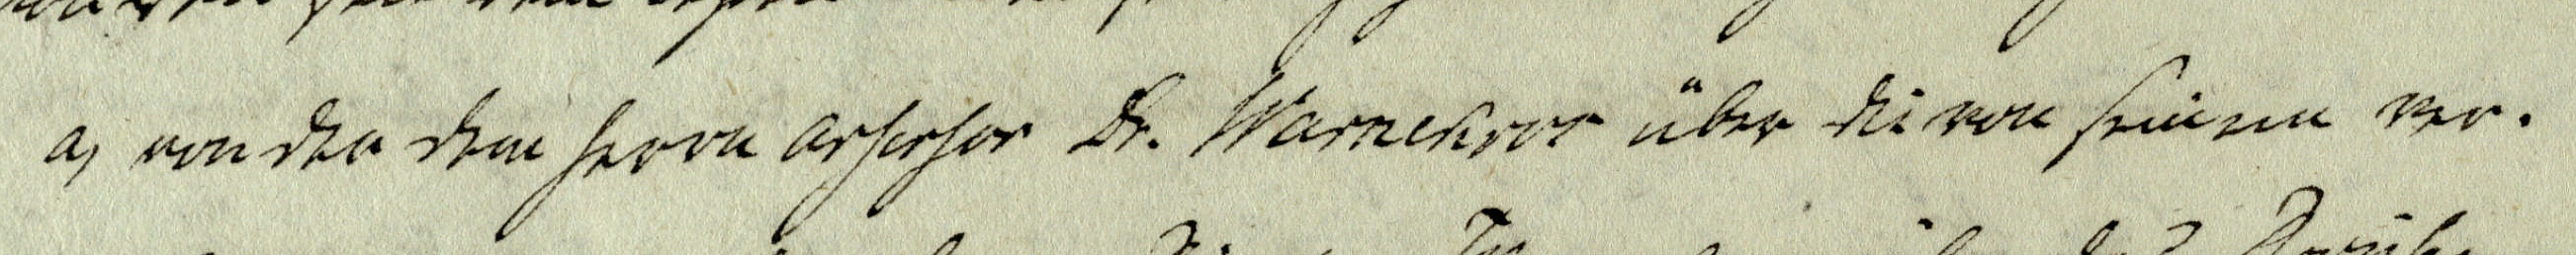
a, von der dem Herrn Assessor Dr. Warnekros über die von seinem ver¬
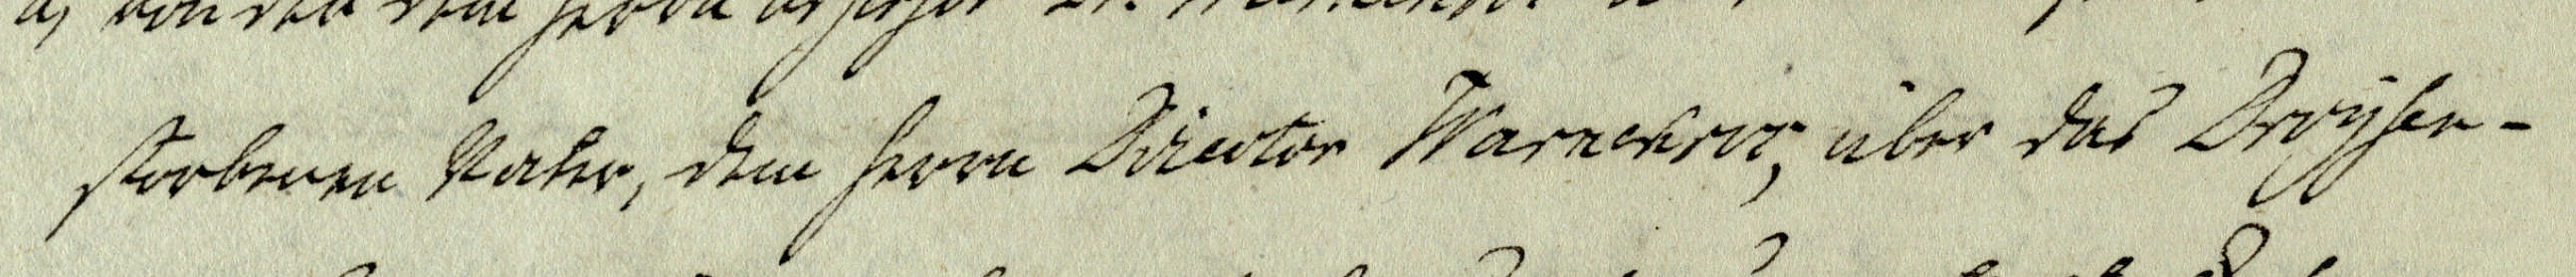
storbenen Vater, dem Herrn Director Warneckros, über das Droÿsen¬
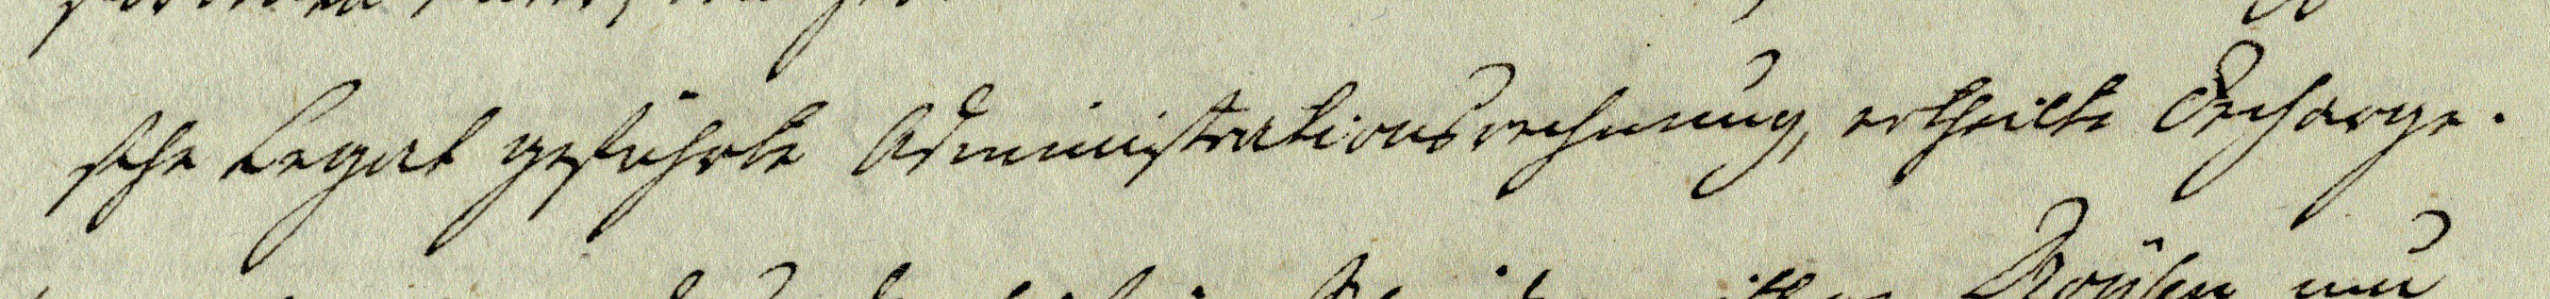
sche Legat geführte Administrationsrechnung, ertheilte Decharge.
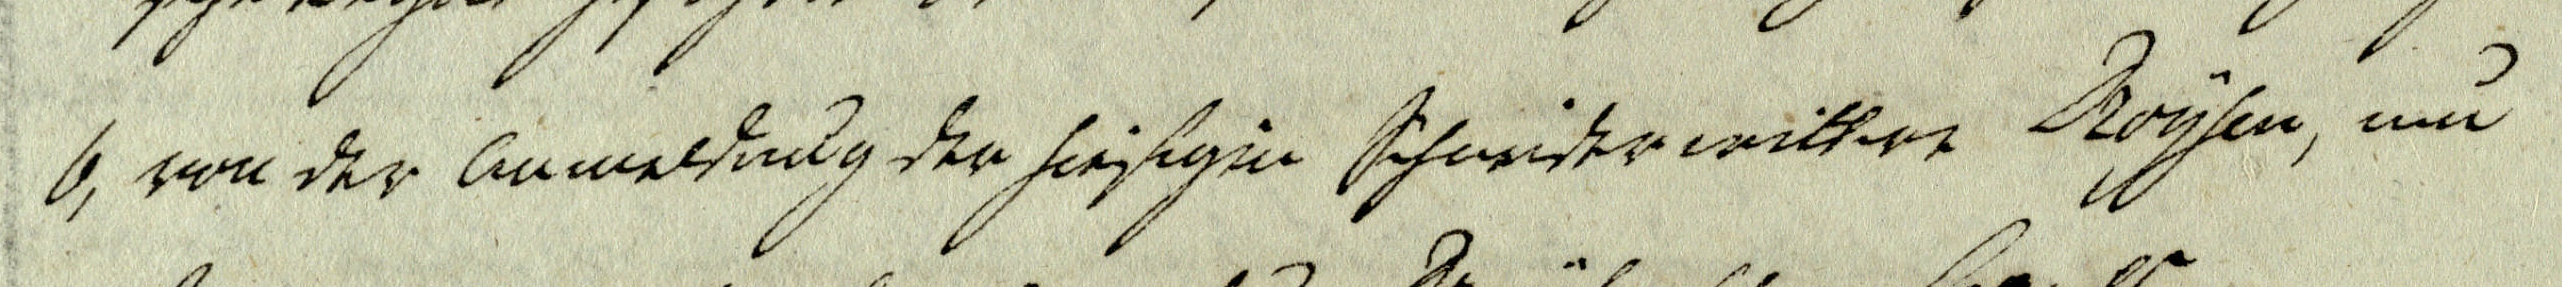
b, von der Anmeldung der hiesigen Schneiderwittwe Droÿsen, um
